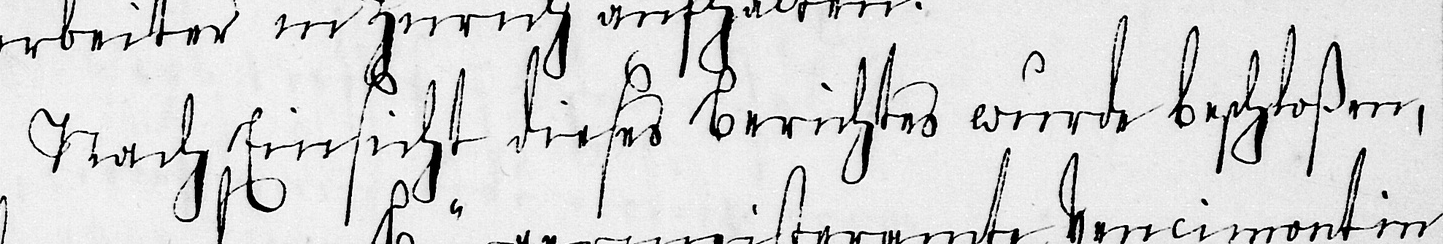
Nach Einsicht dieses Berichtes wurde beschloßen,
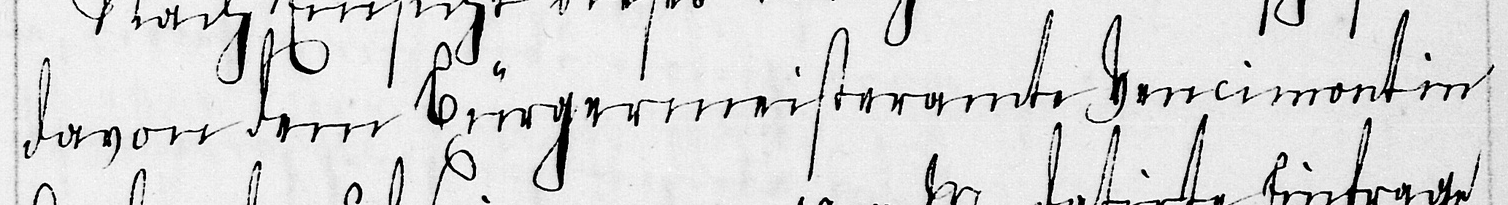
davon dem Bürgermeisteramte Vencimont in
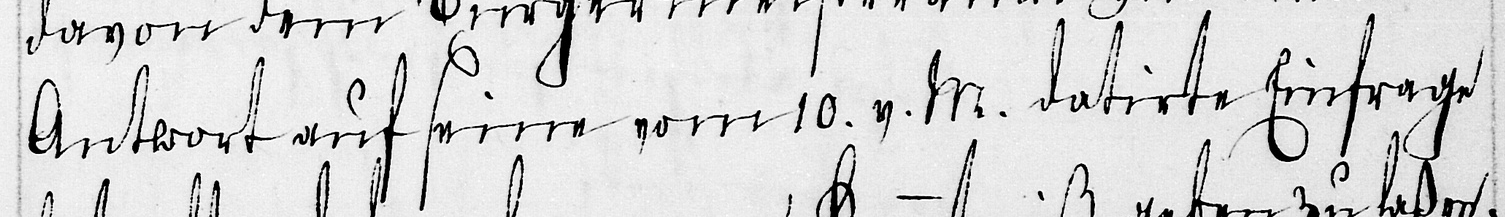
Antwort auf seine vom 10. v. M. datirte Einfrage
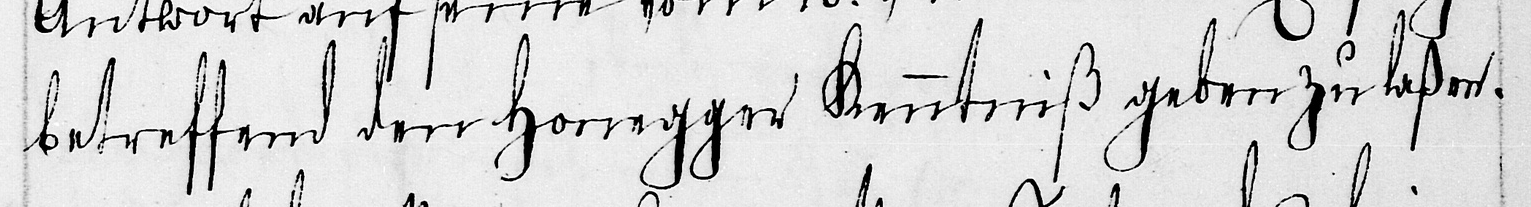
betreffend den Honegger Kenntniß geben zu laßen.
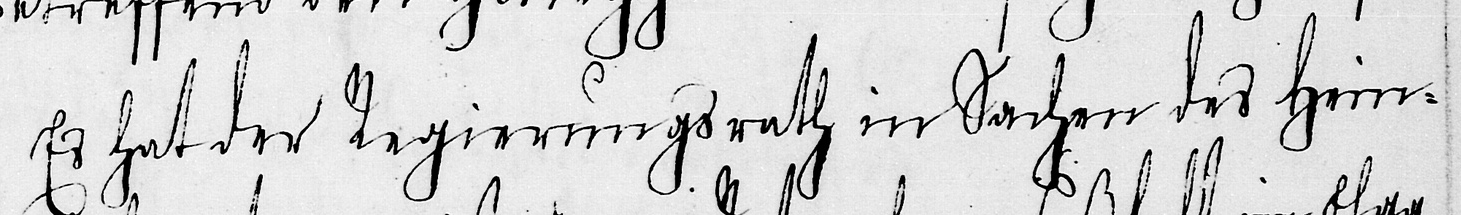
Es hat der Regierungsrath in Sachen des Hein¬
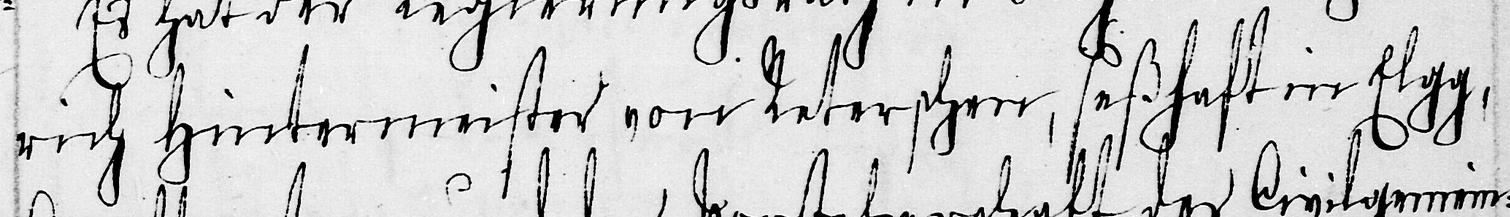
rich Hintermeister von Reterschen, seßhaft in Elgg,
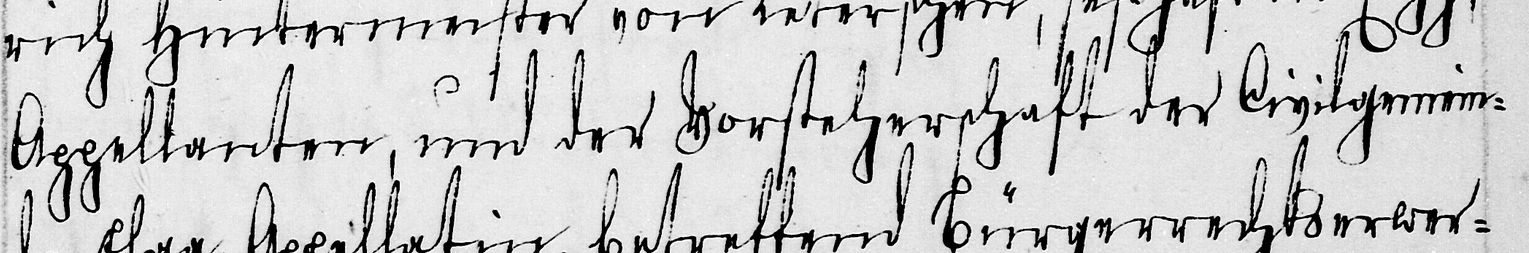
Appellanten, und der Vorsteherschaft der Civilgemein¬
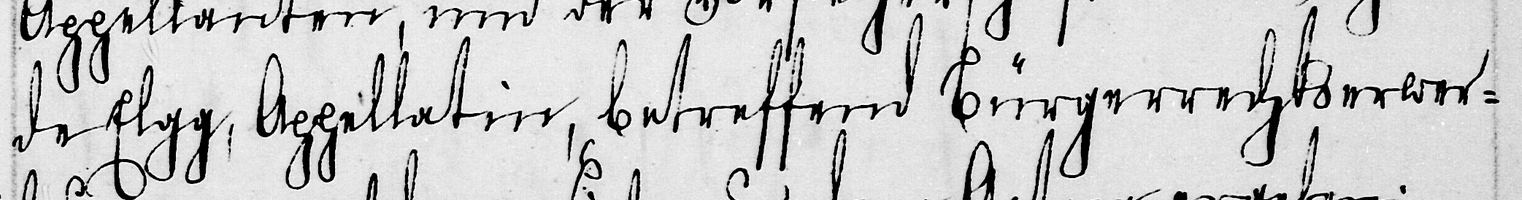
de Elgg, Appellatin, betreffend Bürgerrechtserwer¬
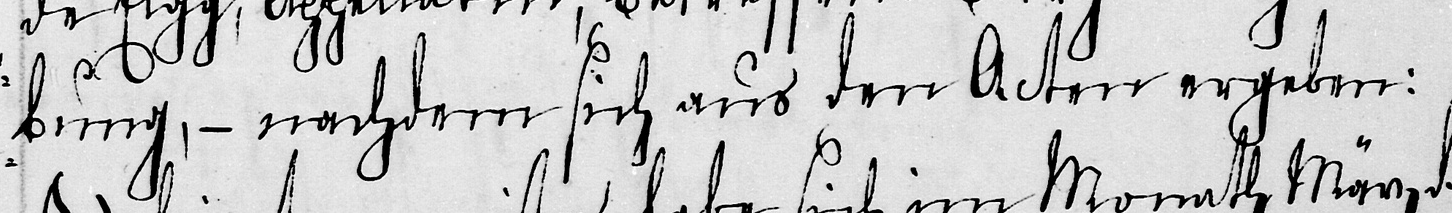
bung, – nachdem sich aus den Acten ergeben:
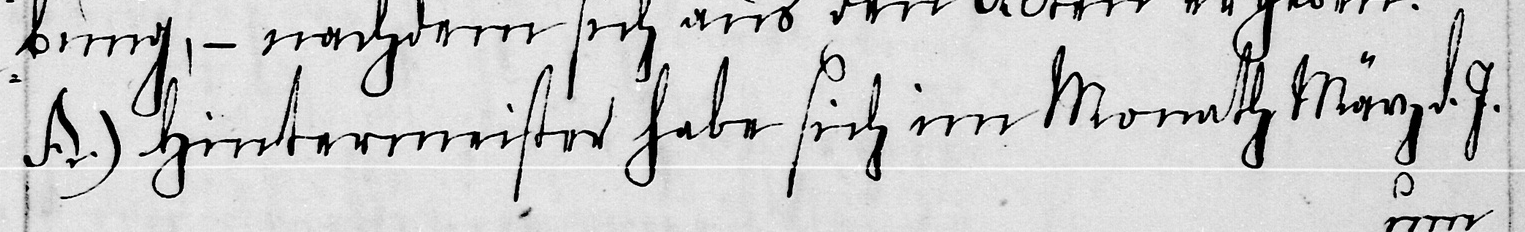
A.) Hintermeister habe sich im Monath März d. J.
